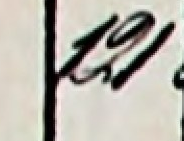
121
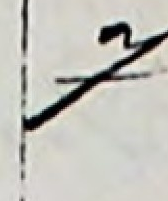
7
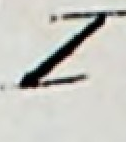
I
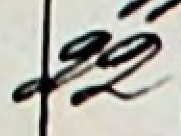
22
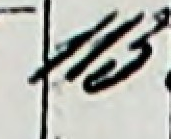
115
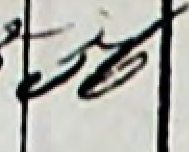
56
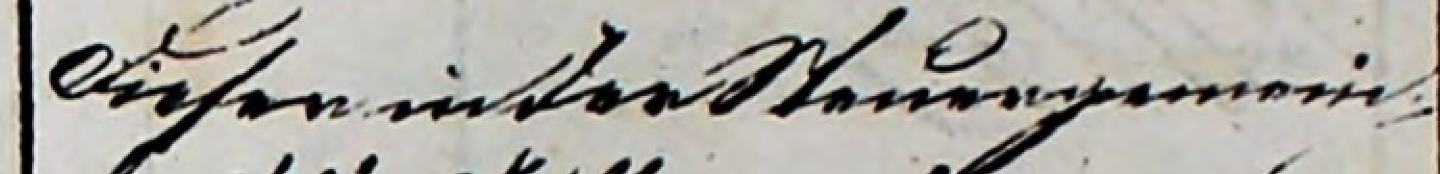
Firser in der Steuergemein=
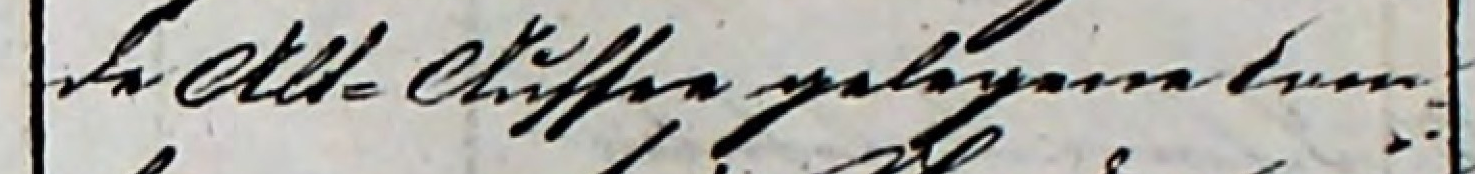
de Alt=Aussee gelegene Com=
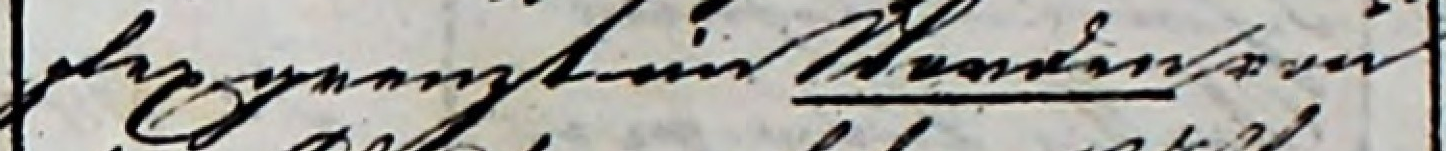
plex grenzt im Norden von
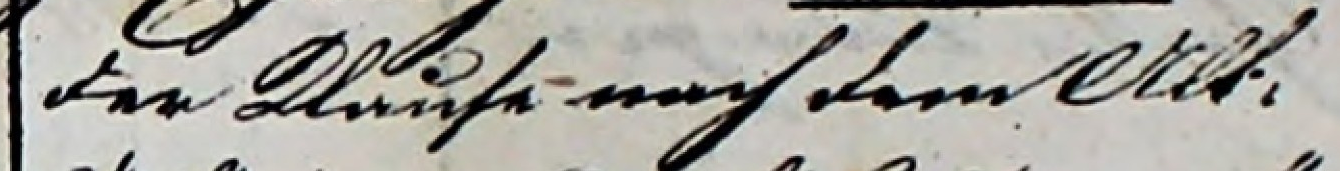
der Klause nach dem Alt=
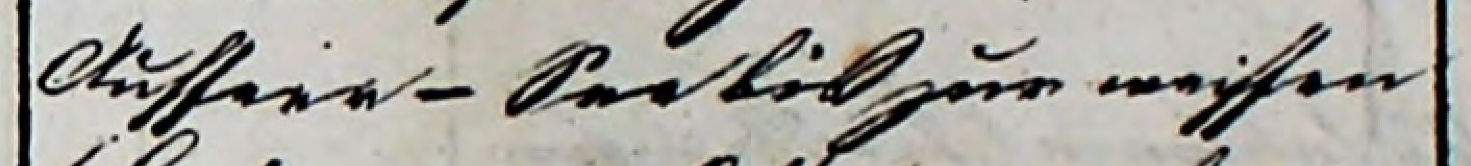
Ausseer–See bis zur weissen
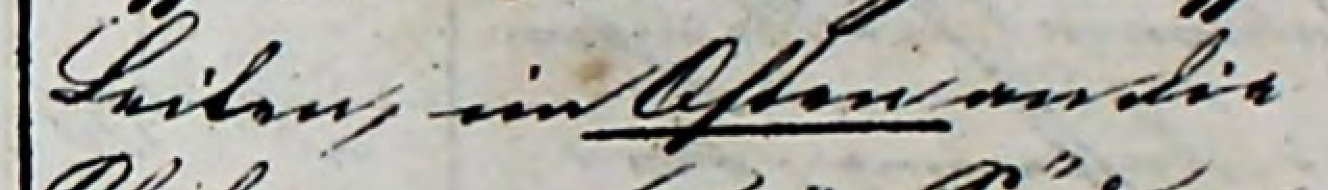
Leiten, im Osten An die
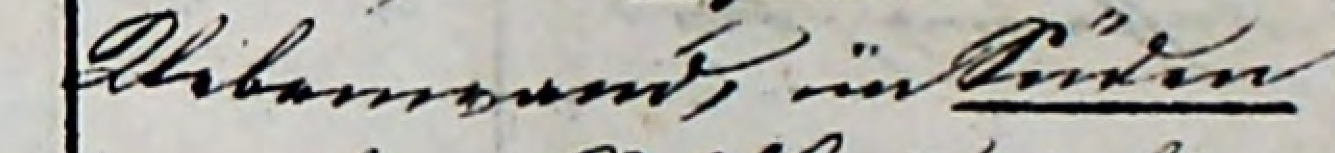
Klebenwand, in Süden
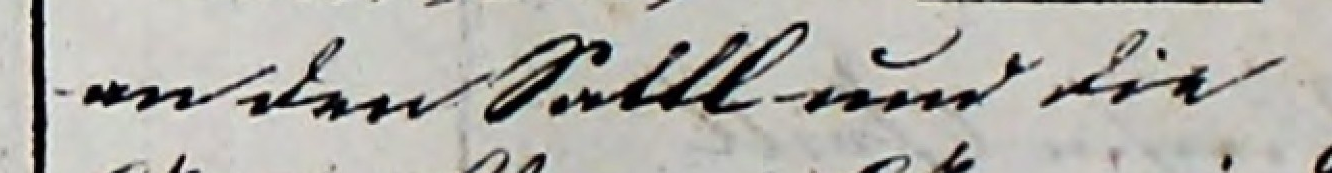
an den Sattl und die
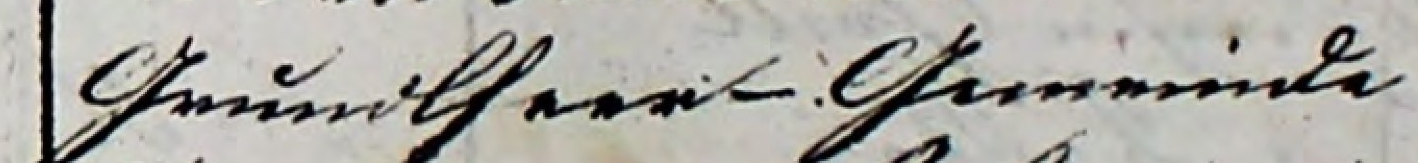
Grundlheer–.Gemeinde
